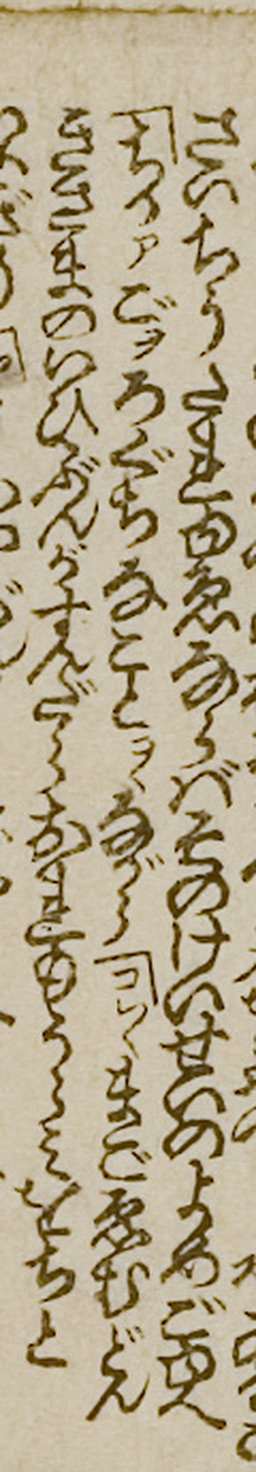「ちかあごをろぐちなことこくながら「これ〳〵まごゑむどん
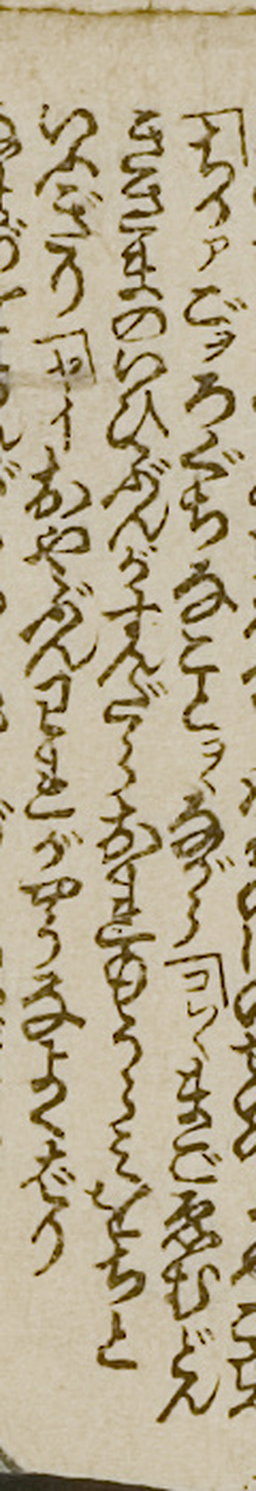きさまのいひぶんがすんだらおれもうらみをちと
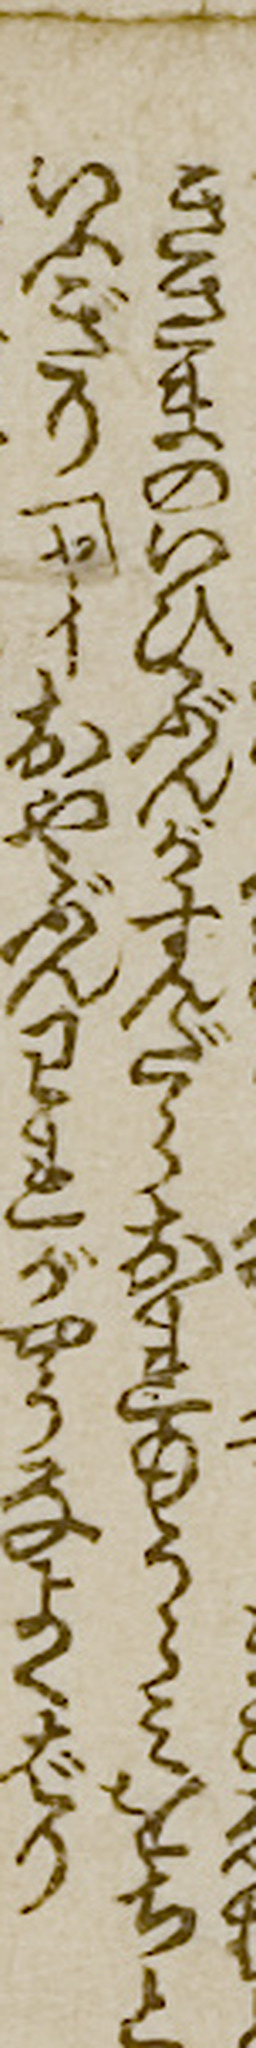いふぎり「やいおやぶんわれがゆうなよくばり
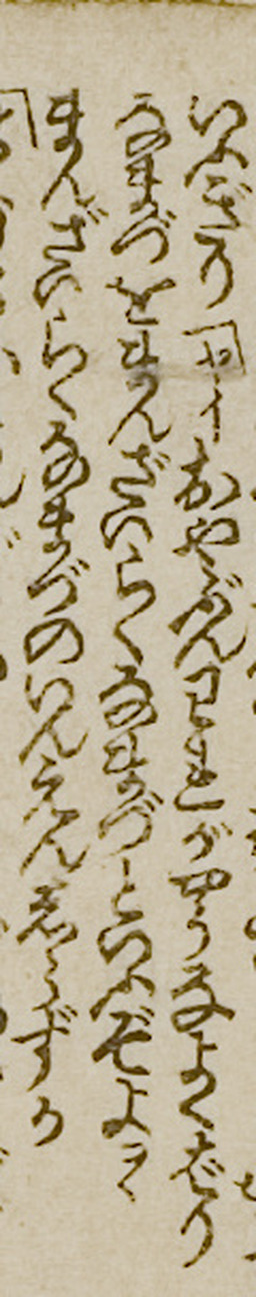なまづをまんざいらくなまづといふぞよこく
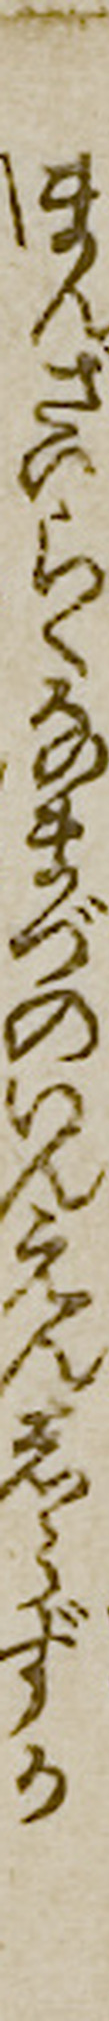まんざいらくなまづのいんえんしらずか
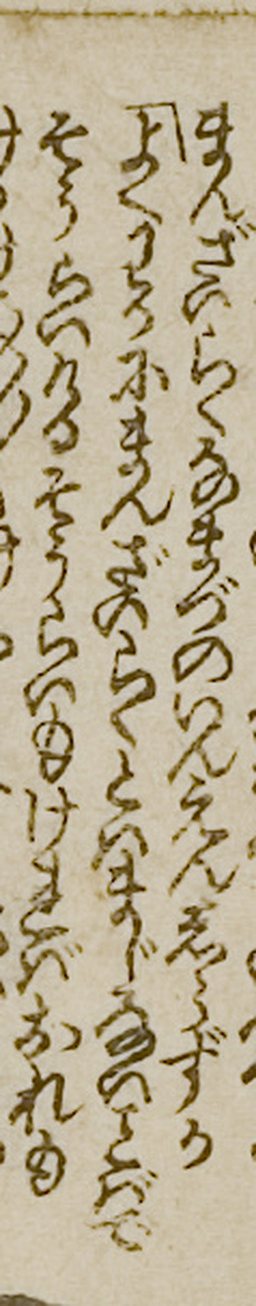「よくわかにまんざいらくとはまじないをばて
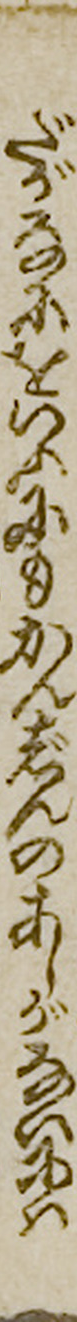だがなにをいふにもかんじんのあしがないには
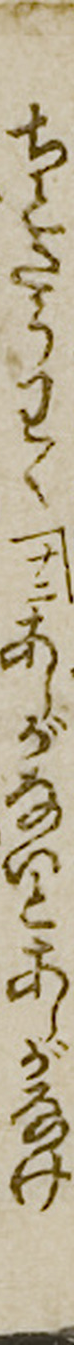ちとたうわく「なにあしがないとあしがなけ
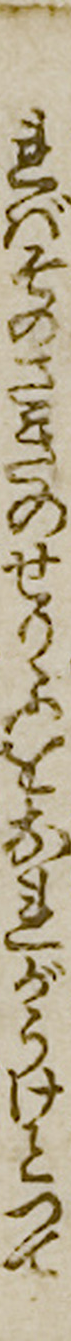ればそのさきのせりふをおれがうけとつて
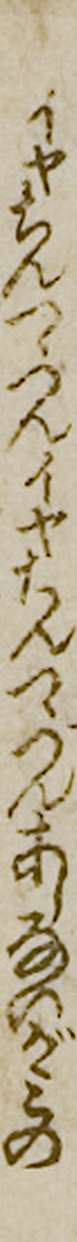いやちんつゝつんいやちんつゝつんあしがないがこの
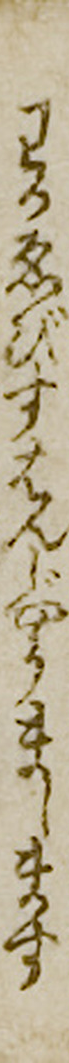わかゑびすはんじゆりまします
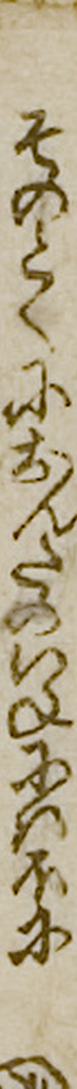そのとくにおんたのいねにはほに
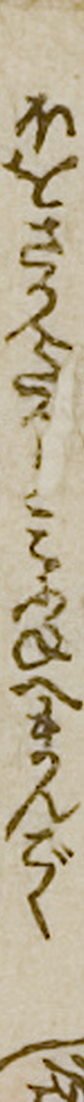ほをさかへたしみにねへまんごく
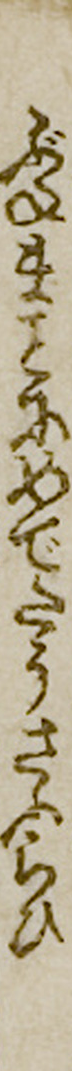ぶねまことにめでたうさふらひ
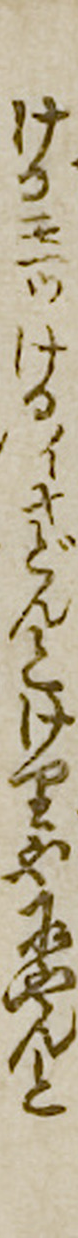けるも一つけるいやどんとけりやにやんと
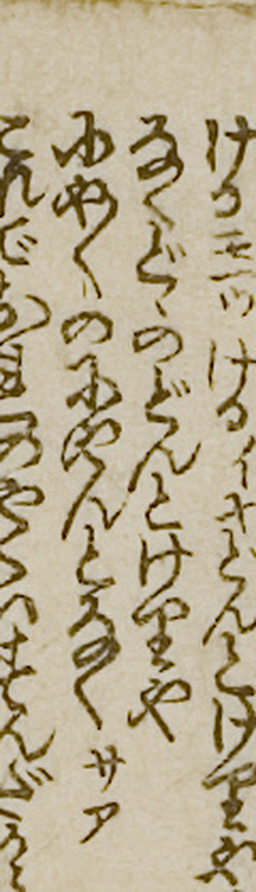なくどゝのどんとけりや
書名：万歳楽鯰の後悔
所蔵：東京大学総合図書館 General Library in the University of Tokyo, JAPAN
